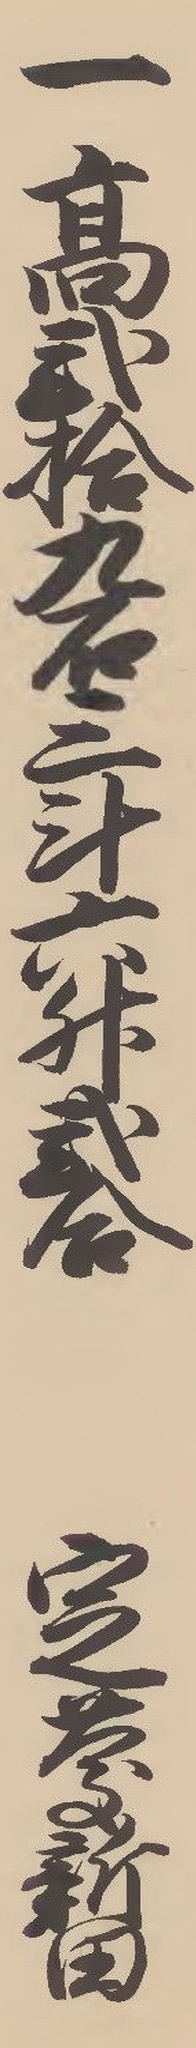一高弐拾九石三斗六升弐合定慶新田
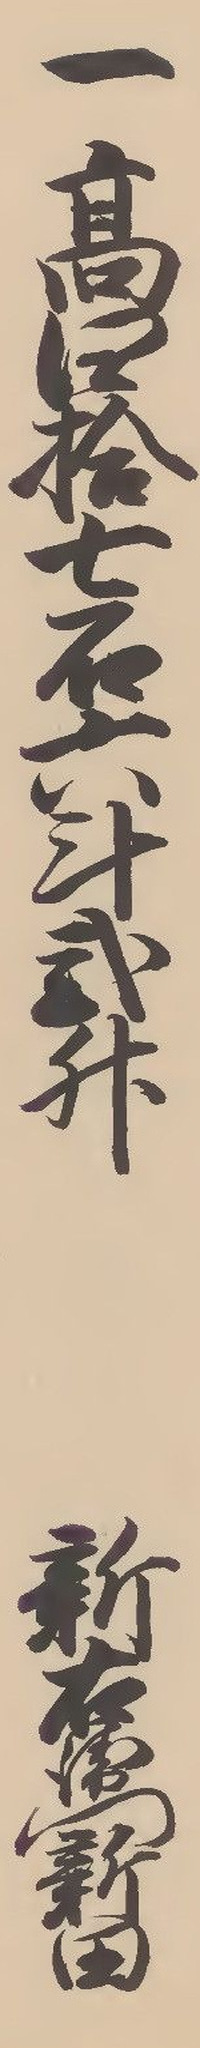一高四拾七石六斗弐升新右衛門新田

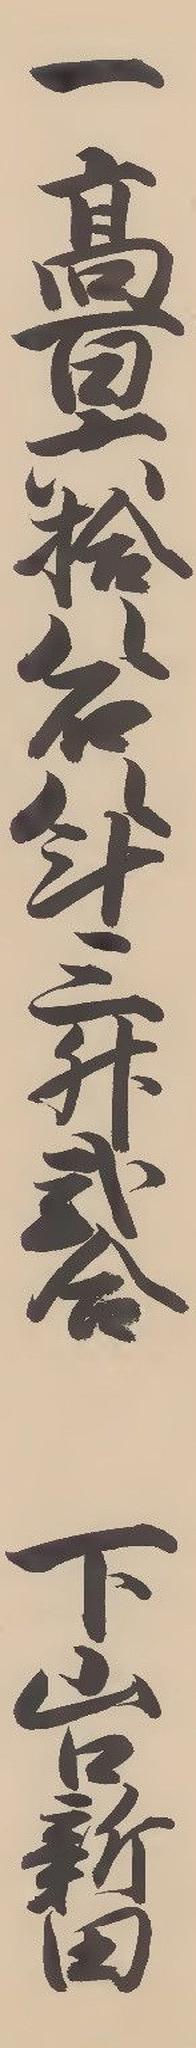一高百六拾八石八斗三升弐合下山口新田
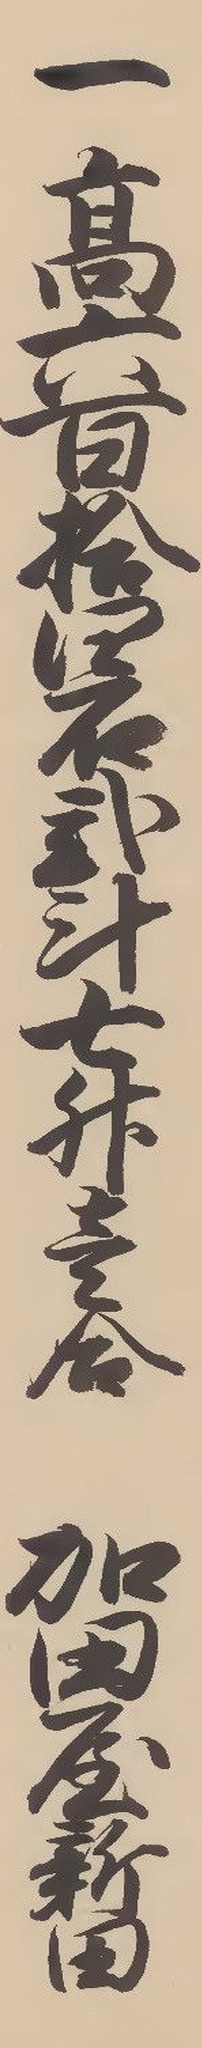一高六百拾四石弐斗七升壱合加田屋新田
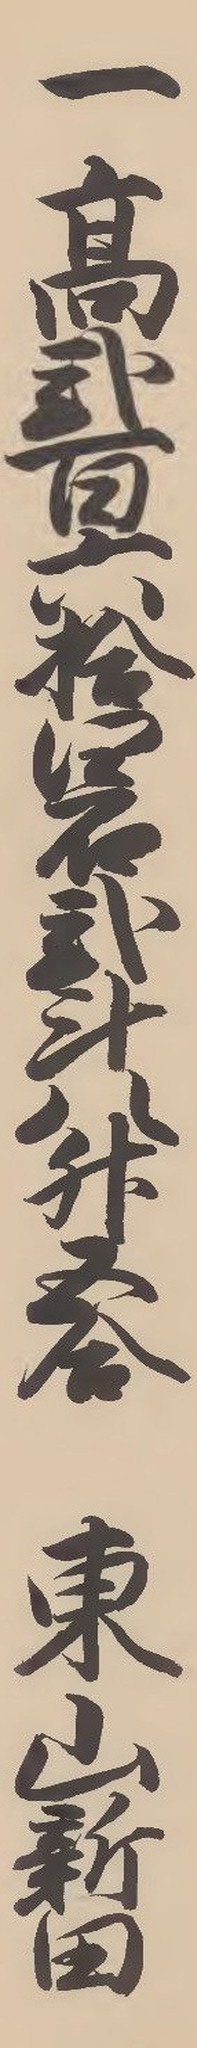一高弐百六拾四石弐斗八升五合東山新田
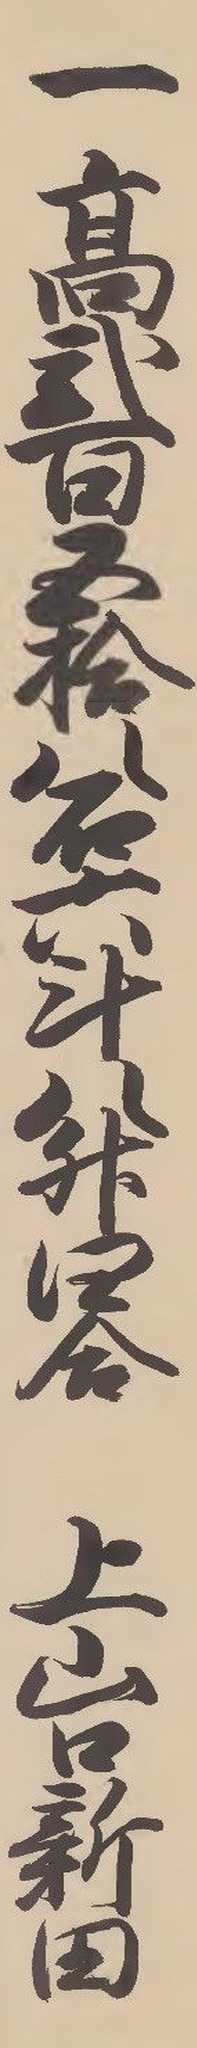一高弐百五拾八石六斗八升四合上山口新田
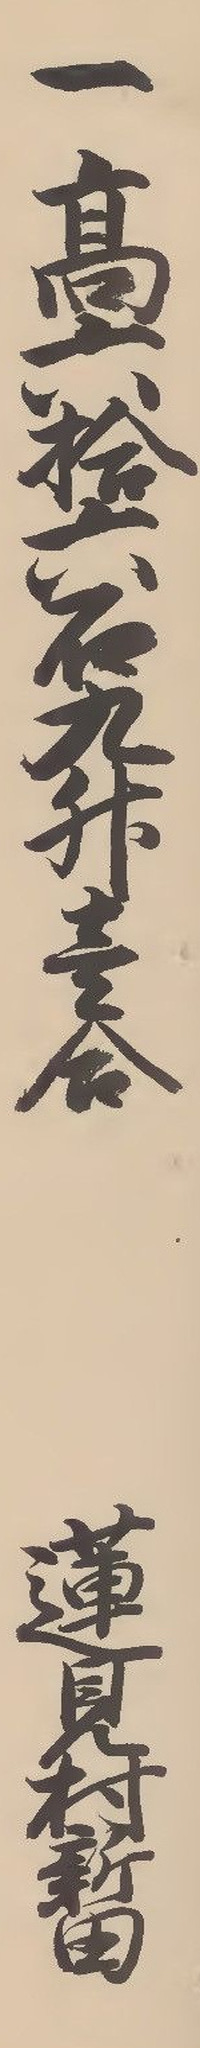一高六拾六石九升壱合蓮見村新田
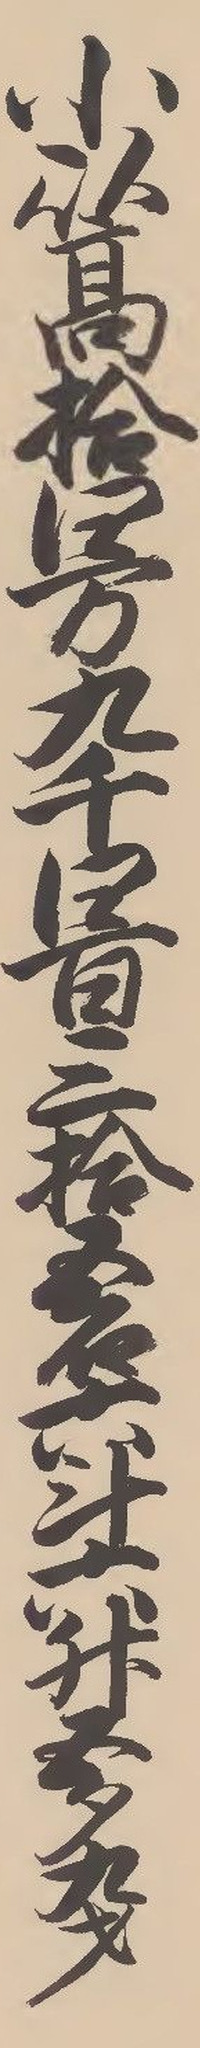小以高拾四万九千四百三拾五石六斗六升五勺九才
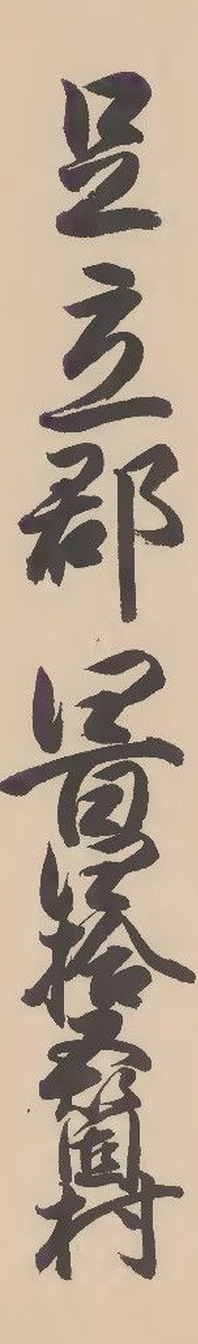足立郡四百四拾五箇村

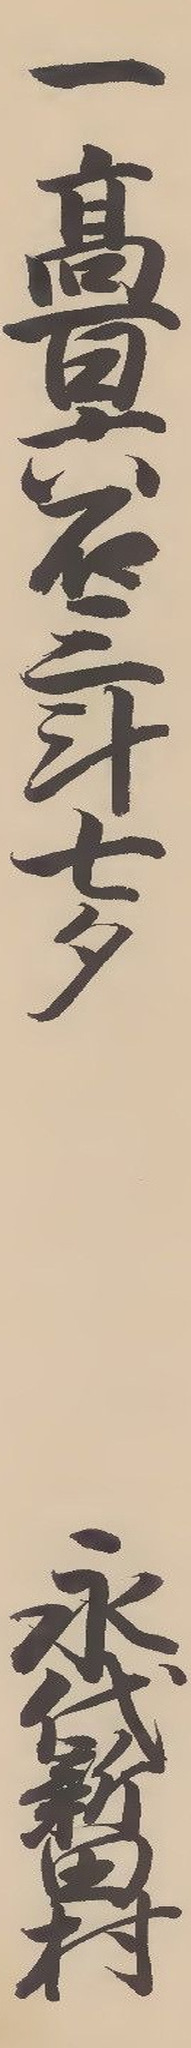一高百六石三斗七勺永代新田村
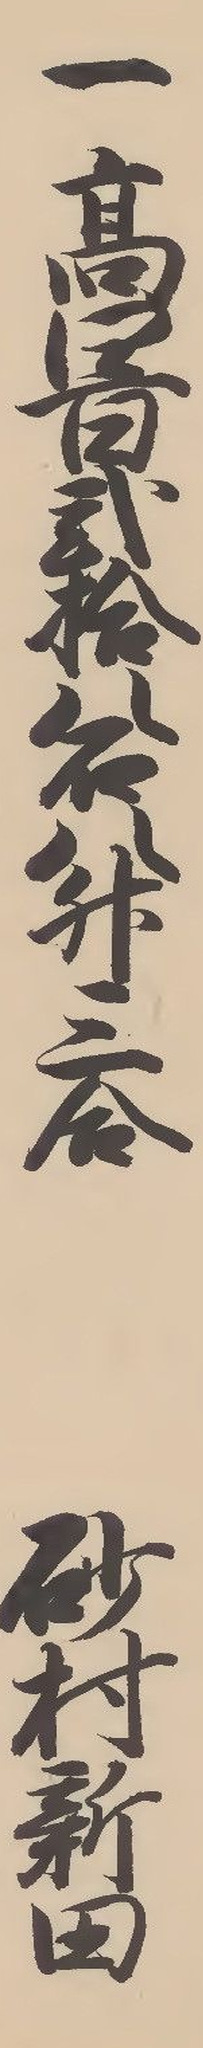一高四百弐拾八石八升三合砂村新田
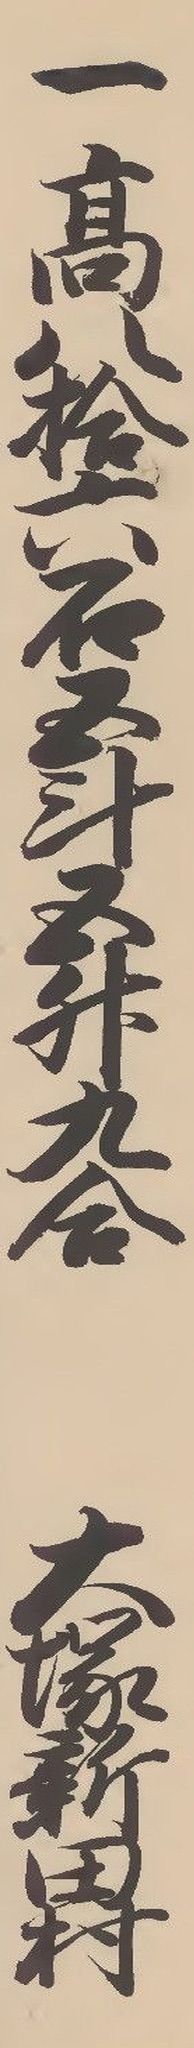一高八拾六石五斗五升九合大塚新田村
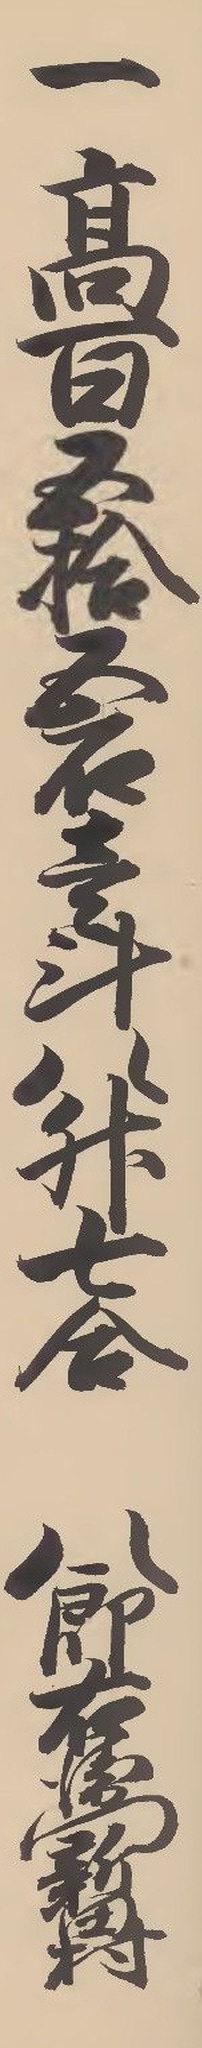一高百五拾五石壱斗八升七合八郎右衛門新田村
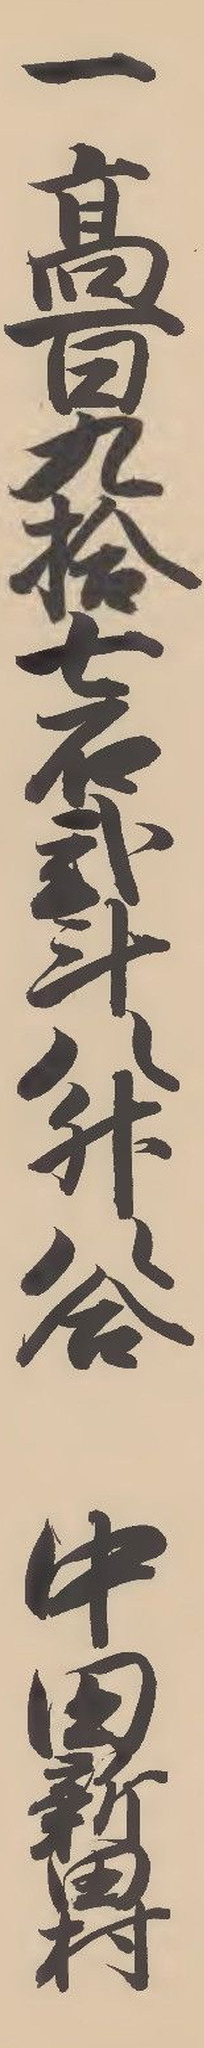一高百九拾七石弐斗八升八合中田新田村
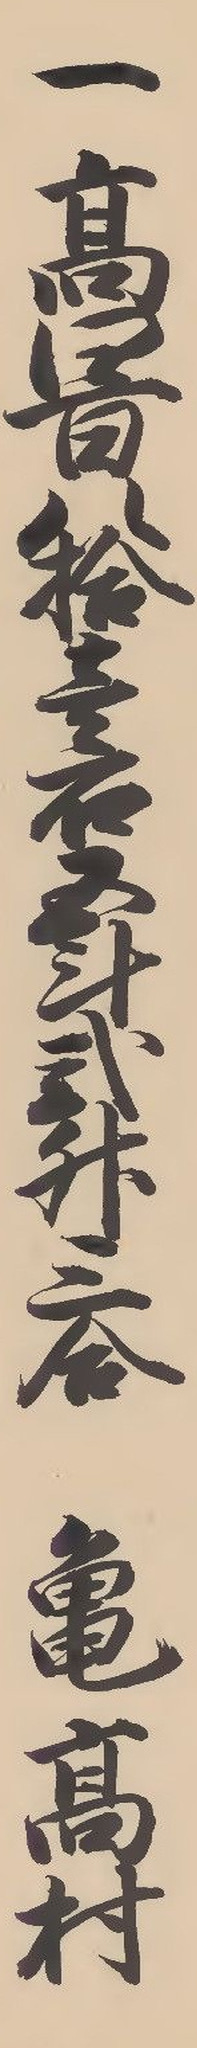一高四百八拾壱石五斗弐升三合亀高村

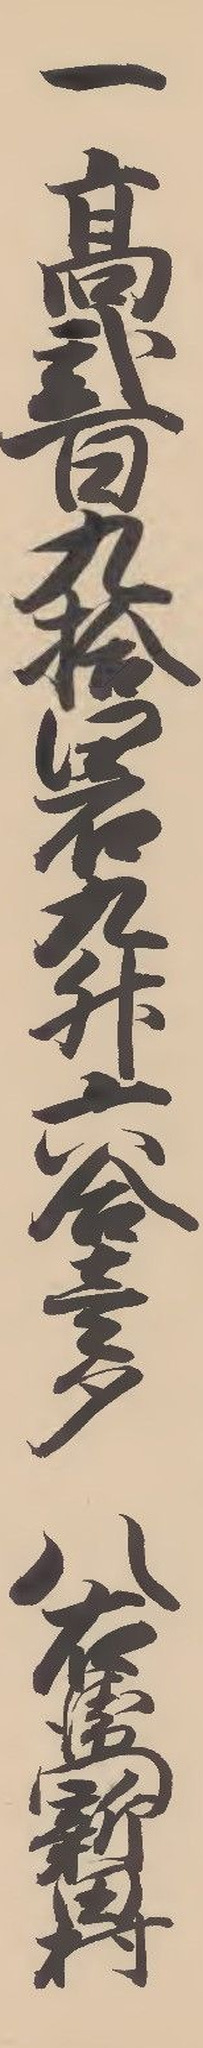一高弐百九拾四石九升六合壱勺八右衛門新田村
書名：武蔵国郷帳　下
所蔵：国立公文書館 National Archives of Japan
